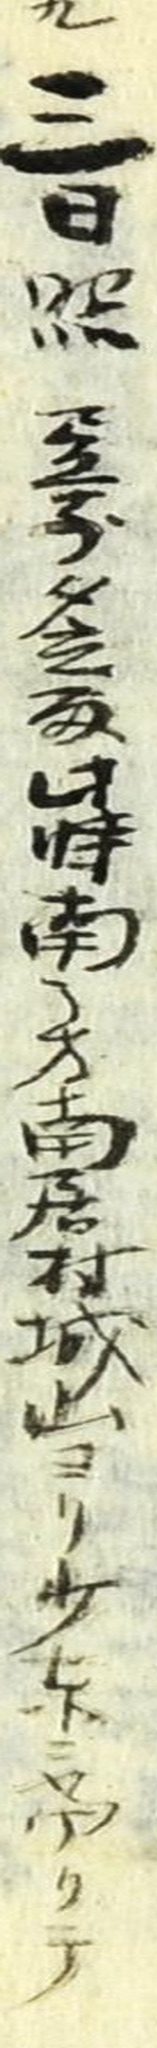三日照昼前夕立雨此時南之方南居城山ヨリ少東ニ当リテ
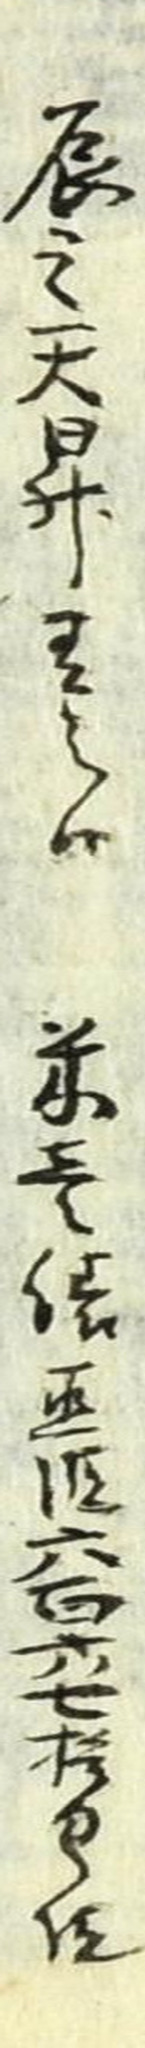辰之天昇有之候米壱俵直段六百六七拾匁位
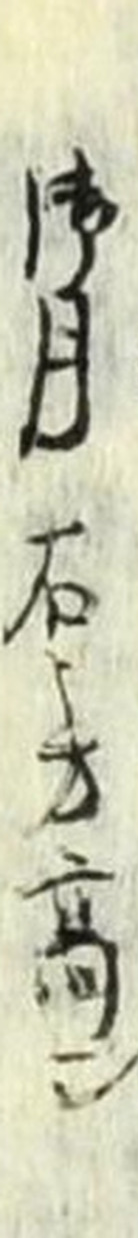御月右之方高シ
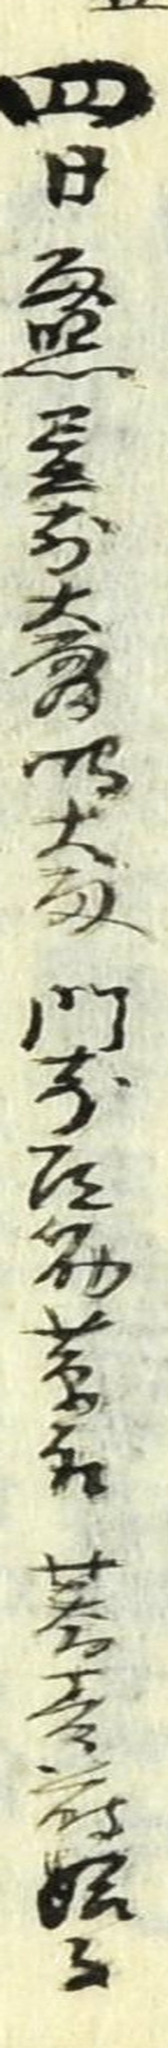四日雨照昼前大雷鳴大雨門前道筋草取蕎麦蒔始る
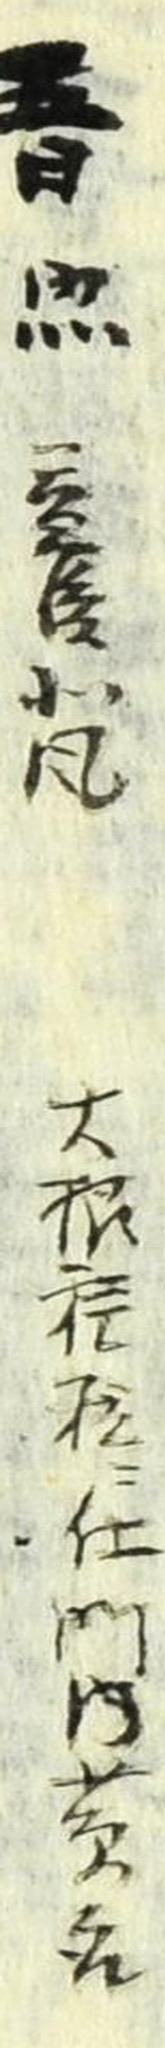五日照昼後北風大根種粒ニ仕門内草取
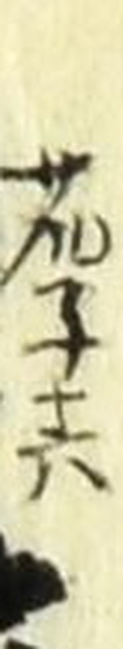「茄子十六
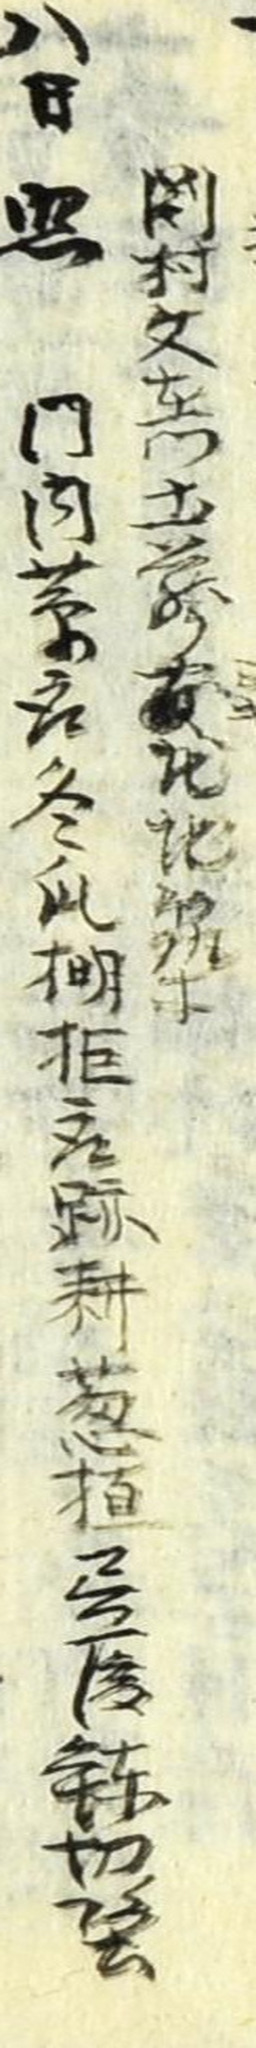八日照門内草取冬瓜棚拒取跡耕葱植昼後鯟切
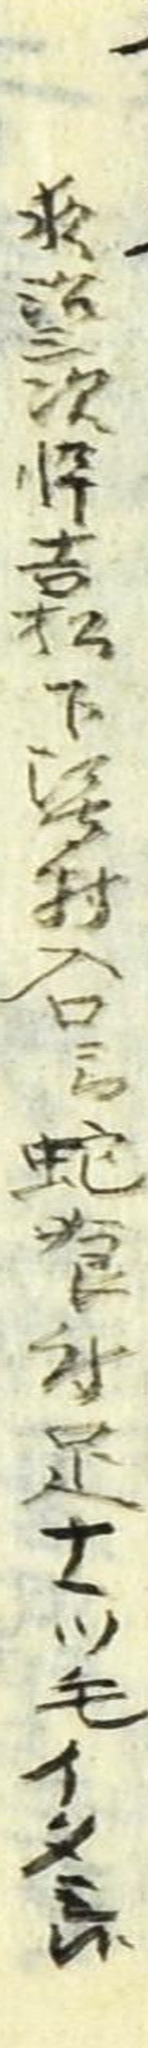夜治三次倅吉松下江守村入口ニ而蛇喰付足ナヽツモイタミ候
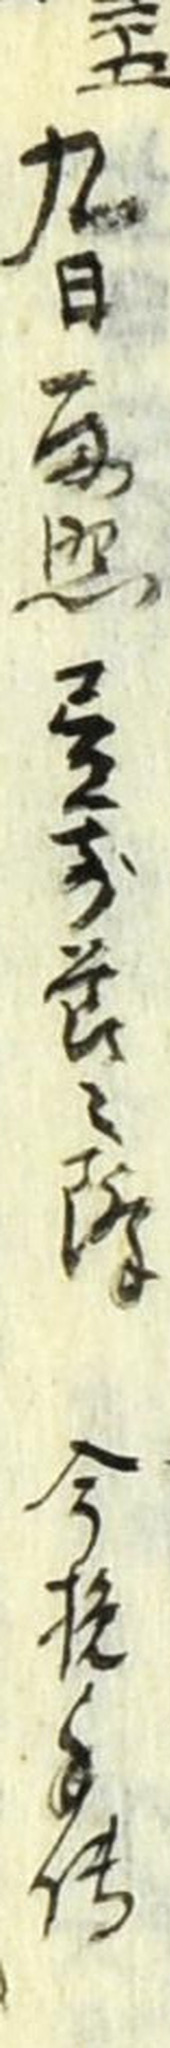九日雨照昼前節々際今挽手伝
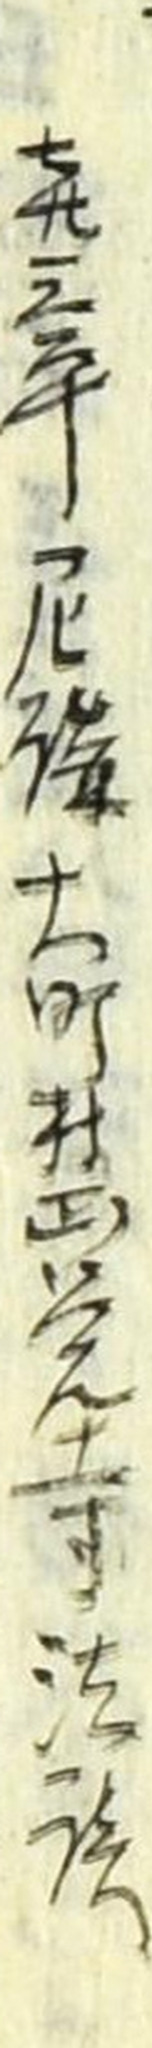喜三平尼講大町村正覚寺法談
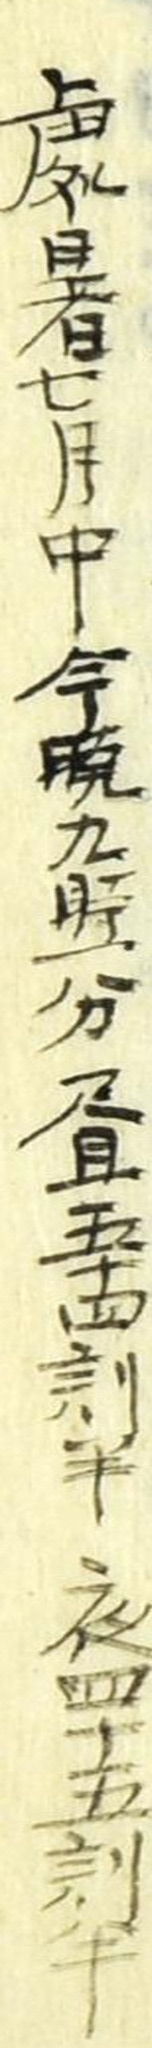処暑七月中今暁九時一分昼五十四刻半夜四十五刻半

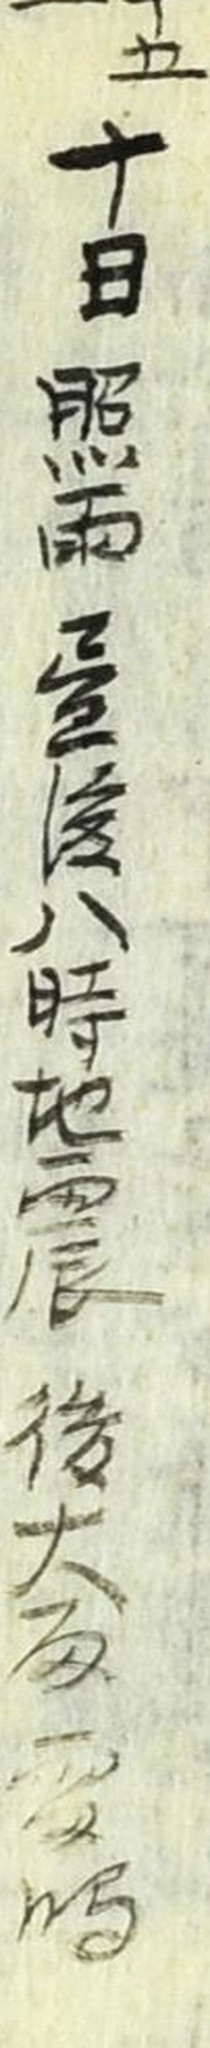十日照雨昼後八時地震後大雨雷鳴
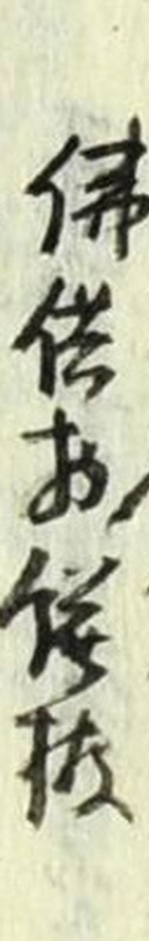仏供お餅拵
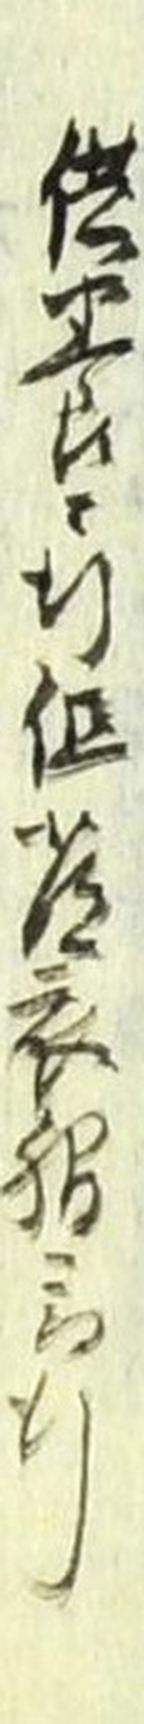供養ニ行但常衣服ニ而行
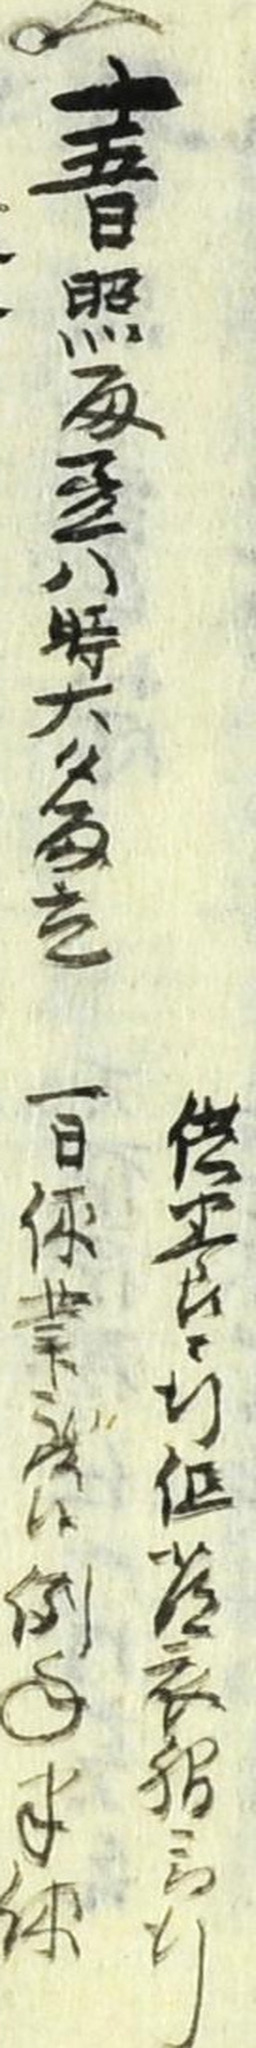△十五日照雨昼八時大夕雨立一日休業致候例年半休
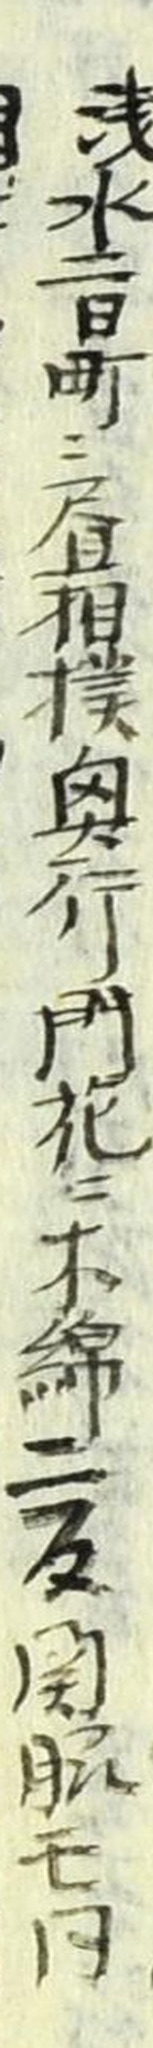○浅水二日町ニ昼相撲興行門花ニ木綿二反関脇モ同
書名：（日記）
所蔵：福井県文書館 Fukui Prefectural Archives
